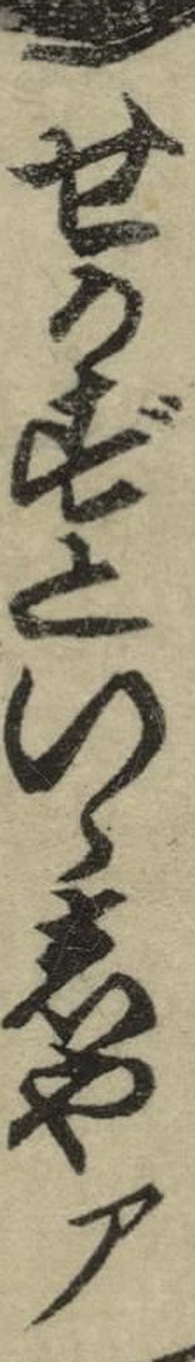せかずといゝしやァ
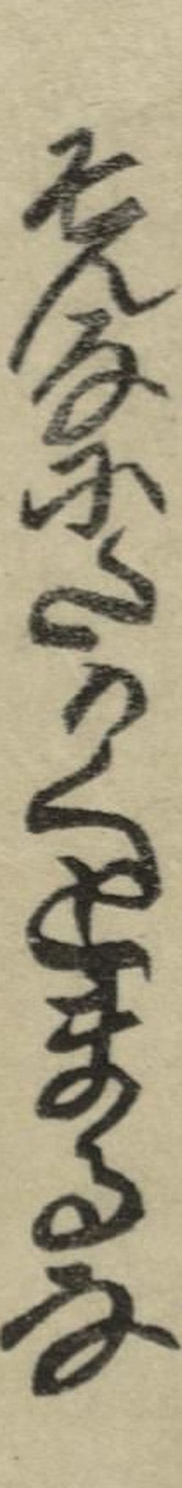そんなにたかくとまるな
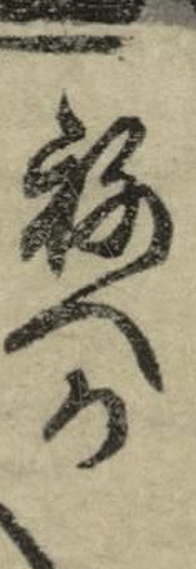ねへか
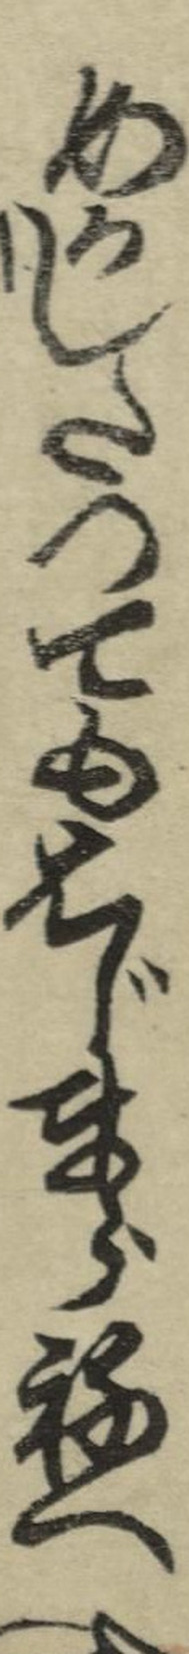めかしたつてもはじまらねへ
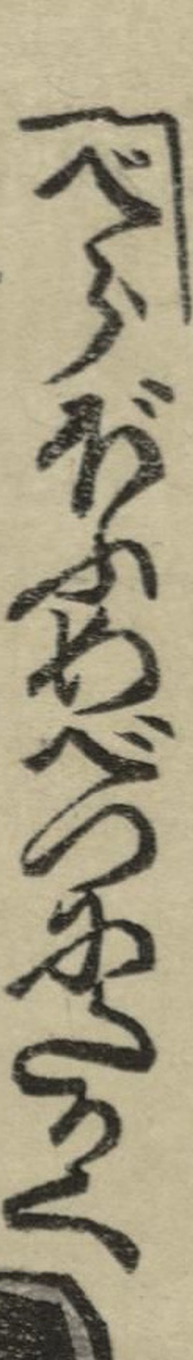〽べらぼふめべつにたかく
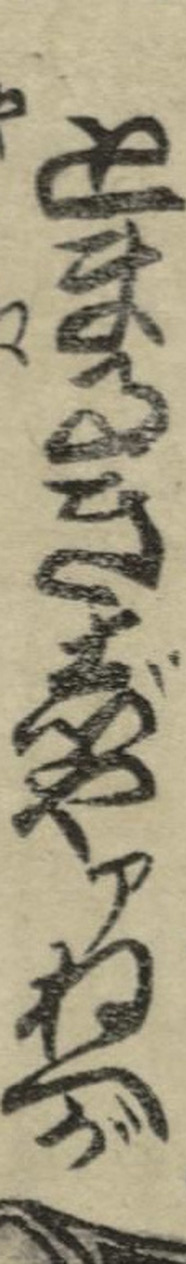とまるきじやァねへが
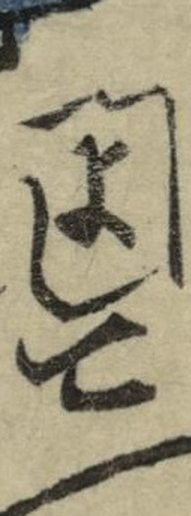〽よして
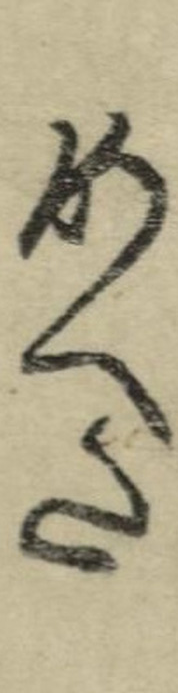めへた
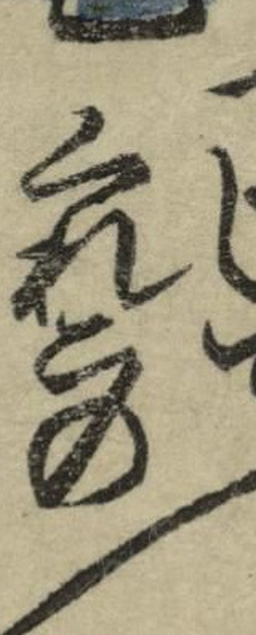くれこの
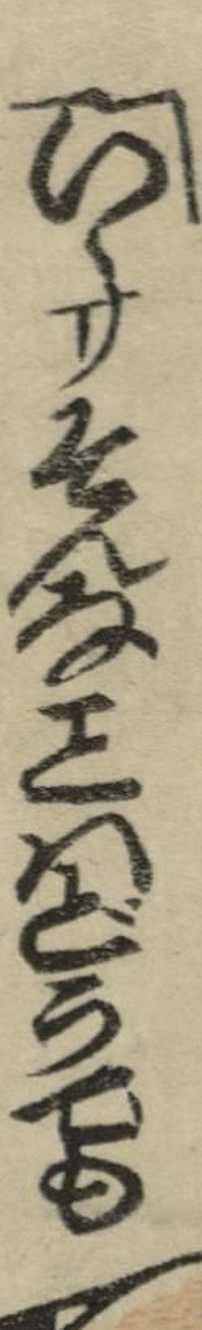〽いゝサそんなことはどうても
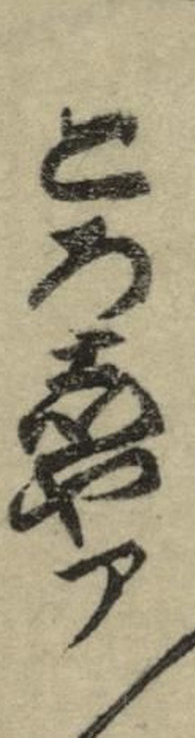ころしやァ
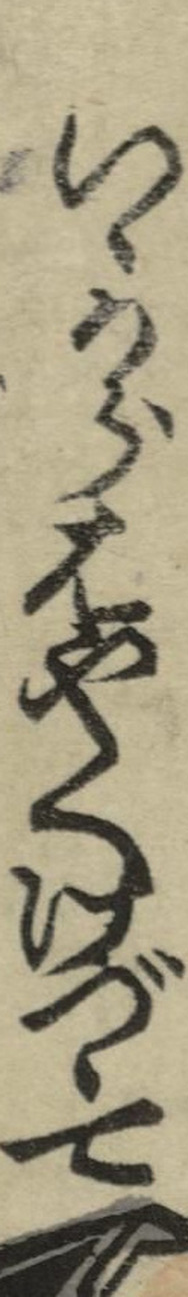いゝからはやくけづゝて
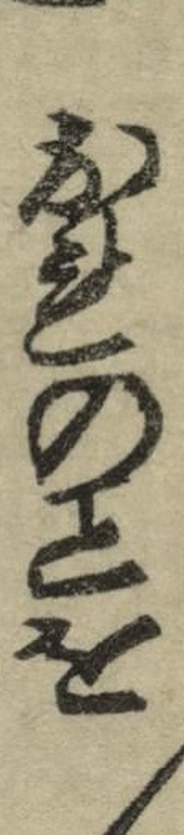おれのことを
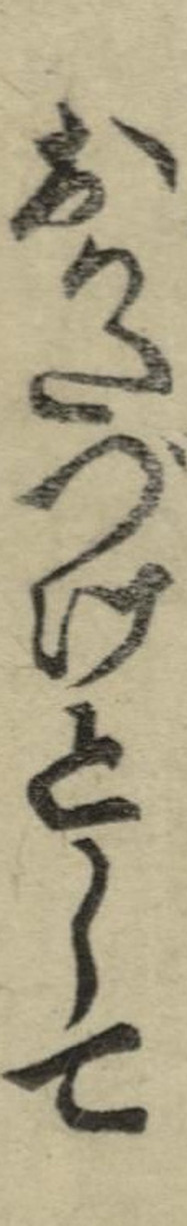おかたづけとして
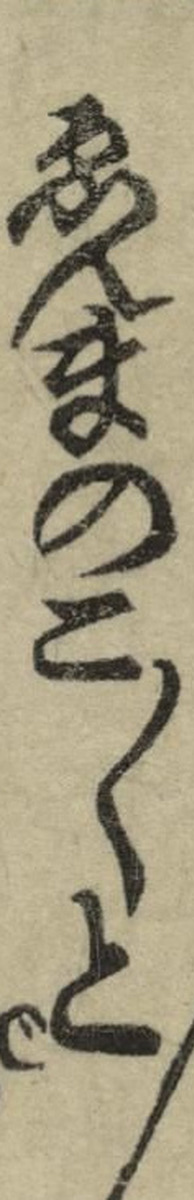ゑんまのこ〳〵と
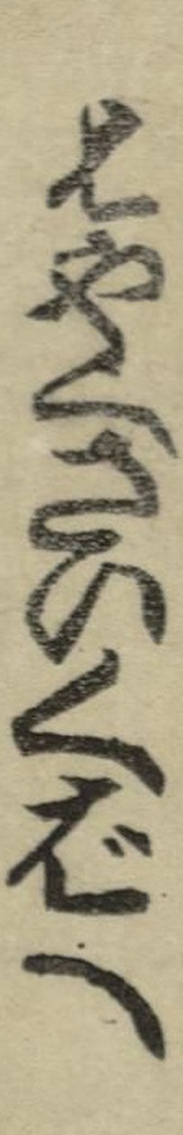はやくさいくばへ
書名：瓢箪
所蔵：東京大学地震研究所図書室 Earthquake Research Institute Library, The University of Tokyo, JAPAN
